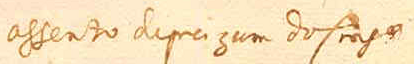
assento de prizam do Conso
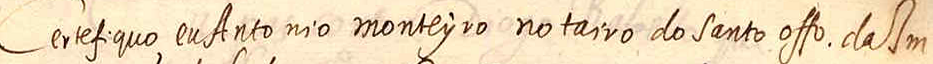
Certefiquo eu Antonio monteyro notairo do Santo offo. da Im
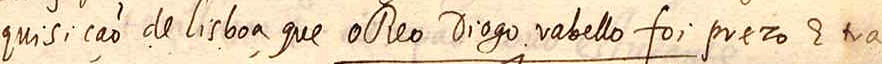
quisiçaõ de Lisboa, que o Reo Diogo rabello foi prezo E tra
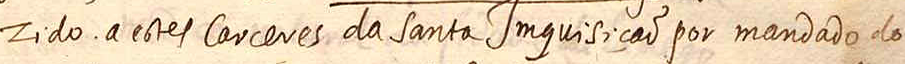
zido a estes Carceres da Santa Imquisiçaõ por mandado do
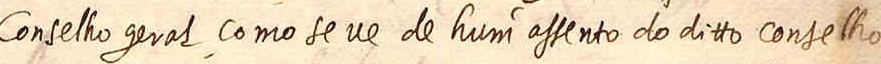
Conselho geral, como se ue de hum assento do ditto conselho
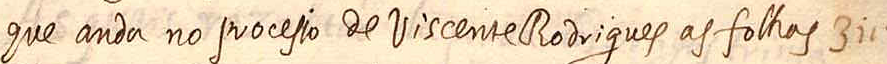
que anda no processo de Viscente Rodrigues as folhas 311.
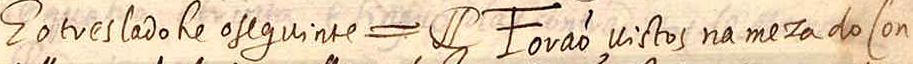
E o treslado he o seguinte = ⁋ Foraõ uistos na meza do Con
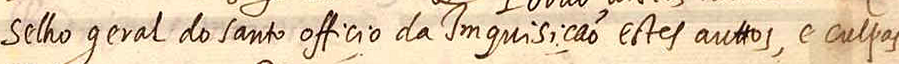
selho geral do santo officio da Imquisiçaõ estes auttos, e culpas
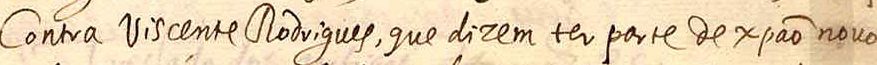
Contra Viscente Rodrigues, que dizem ter parte de xpão nouo
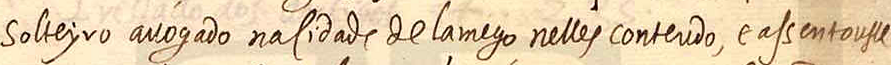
solteyro auogado na Cidade de lamego nelles conteudo, e assentousse
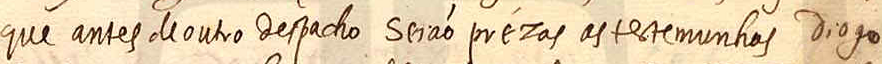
que antes de outro despacho seiaõ prezas as testemunhas Diogo
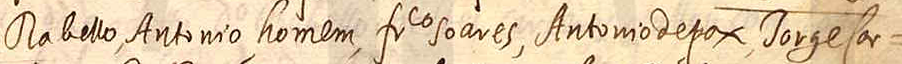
Rabello, Antonio homem, frco soares, Antonio de pax, Iorge Car
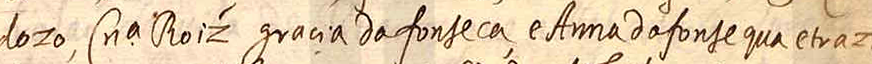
dozo, Cna. Roiz̄ gracia da fonseca, e Anna da fonsequa e trazi
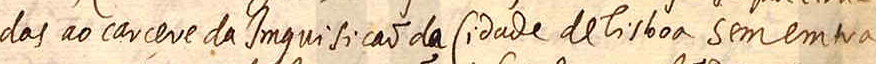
das ao carcere da Imquisiçaõ da Cidade de lisboa sem emtra
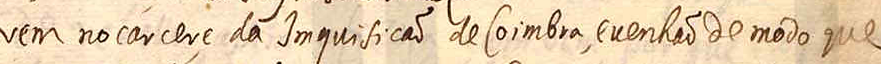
rem no carcere da Imquisiçaõ de Coimbra, e uenhaõ de modo que
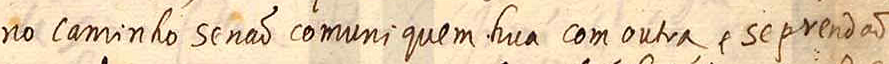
no caminho se naõ comuniquem hua com outra, e se prendaõ
